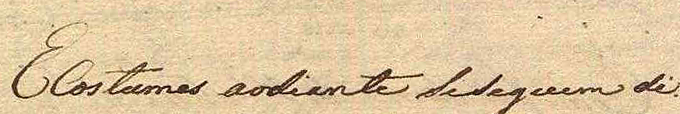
E Costumes ao diante se seguem di
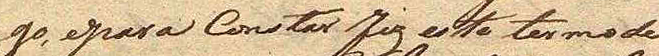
go, e para Constar fiz este termo de
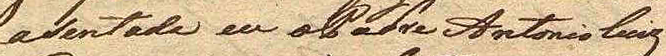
asentada eu o Padre Antonio luiz
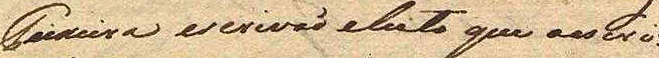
Teixeira escrivaõ eleito que o escri
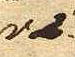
v_
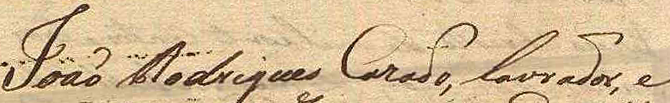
Ioaõ Rodrigues Cazado, lavrador, e
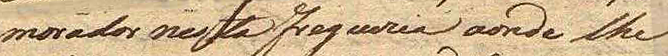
morador nesta freguezia aonde lhe
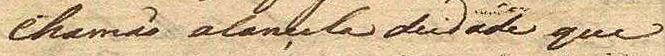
chamão a Cançela de idade que
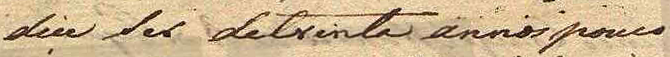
diçe Ser de trinta annos pouco
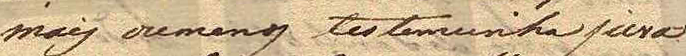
mais ou menos testemunha jura
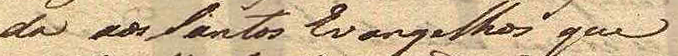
da aos Santos Evangelhos que
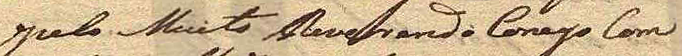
pelo Muito Reverendo Conego Com
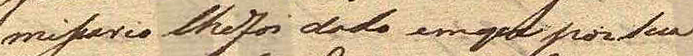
missario lhe foi dado em que poz Sua
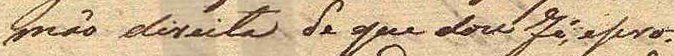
mão direita de que dou fé, e pro
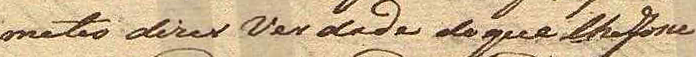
meteo dizer verdade do que lhe fosse
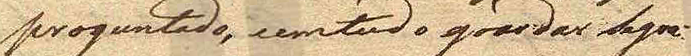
proguntado, e em tudo goardar Segre
